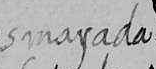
esmayada
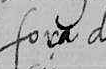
E fora de
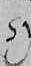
sy
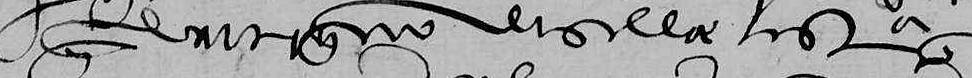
ḡdo artyguo dis ella testa q̄
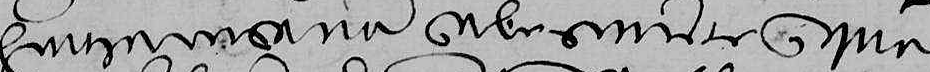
houtra cousa nā sabe somēte q̄ quā
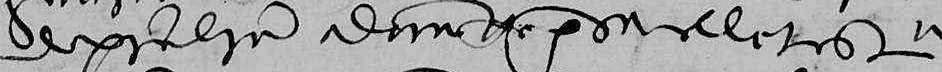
do prēderā a dita Re p̄sa elle testa
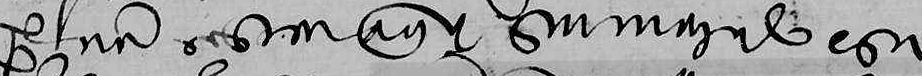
p̄o nā sestar aq̄y seu marydo e sa
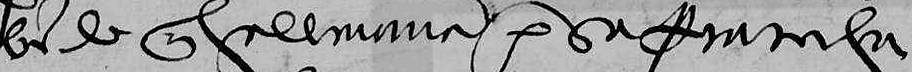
bēdo q̄ ha lleuauā p̄sa fora ter ha
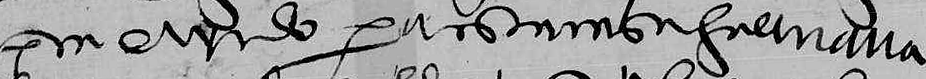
p̄ca e vyndo ꝑa esta casa ha lleuaua
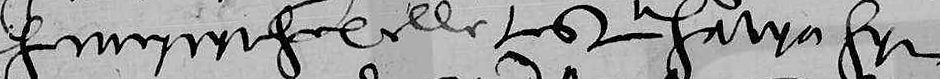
ho meyrynho e elle testa ha vya hyr
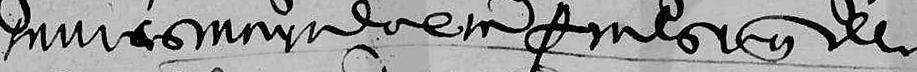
tam esmayada e tā fora de sy q̄ elle
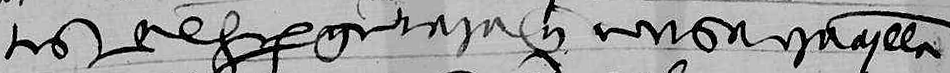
testa lhe ꝑgūtara q̄ cousa era aq̄lla
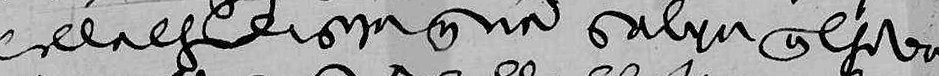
e ella lhe disera q̄ nā sabya q̄ lhe va
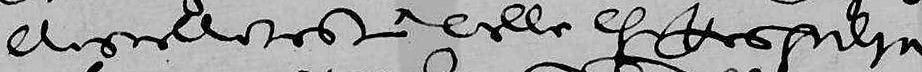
llese elle testa e elle lhe Respondera
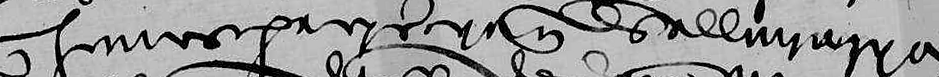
q̄ houuese pacyēcya q̄ d̄s a lliurarya
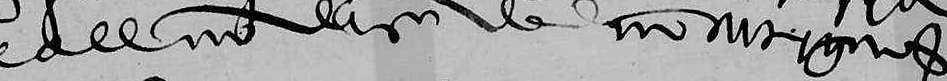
e all n̄o dise do dito artyguo
